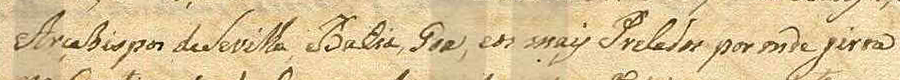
Arcebispos de Sevilha, Bahia, Goa, e os mais Prelados por onde girra
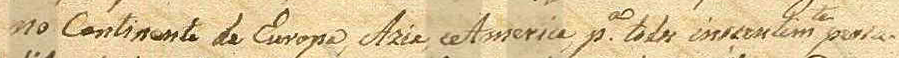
no Continente de Europa, Azia, e America, p.a todos inocentem.te prosu
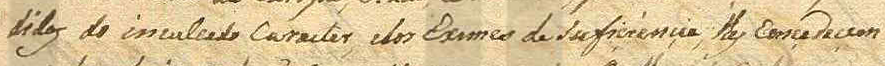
didos do inculcado caracter, e dos Exames de suficiencia, lhes concedecem
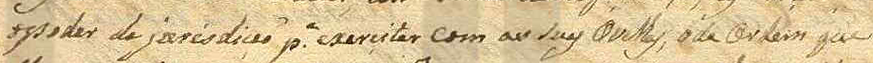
o poder de jurisdiçaõ p.a exercitar com as suas Ovelhas, o de Ordem que
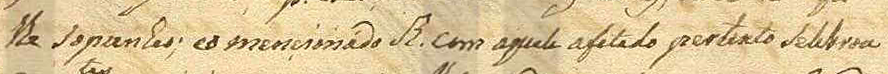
lhe sopunhas; e o mencionado R. com aquele afetado pertexto selebrou
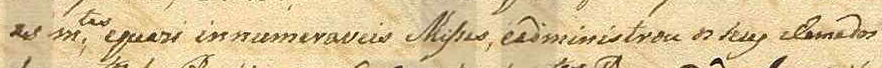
as m.tas e quazi innumeraveis Missas, e administrou os seus chamados
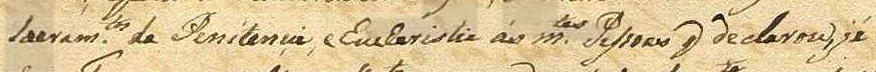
sacram.tos da Penitencia, e Eucharistia ás m.tas Pessoas q̄ declarou, já
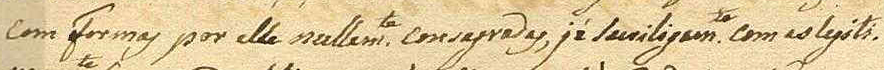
com Formas por elle nullam.te consagradas, já sacriligam.te com as legiti
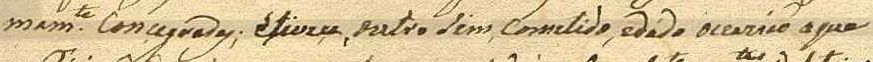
mam.te concegradas; e tivece, outrosim cometido, e dado occaziaõ a que
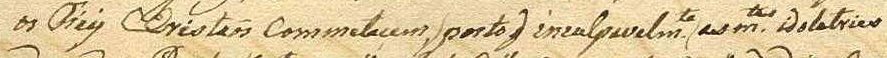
os Freis Christaõs commetecem, posto q̄ inculpavelm.te as m.tas idolatrias
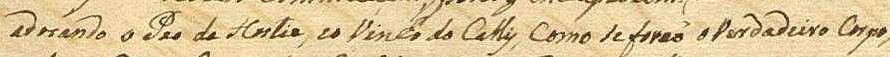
adorando o Pao da Hostia, e o Vinto do Callis, Como se foraõ o verdadeiro Corpo,
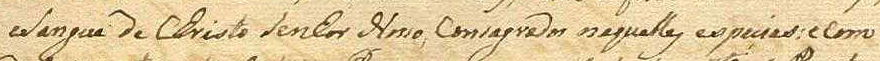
e Sangue de Christo Senhor Nosso, Consagrados naquellas especias; e com
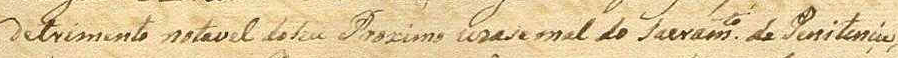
detrimento notavel do seu Proximo uzase mal do sacram.to da Penitencia,
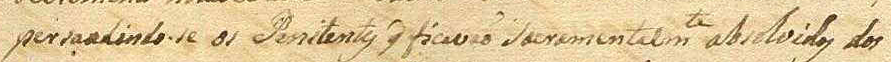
persuadindo-se os Penitentes q̄ ficavaõ sacramentalm.te absolvidos dos
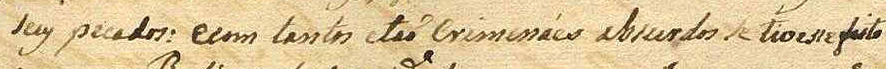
seus pecados: e com tantos e taõ crimináes absurdos se tivesse feito
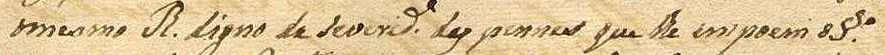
o mesmo R. digno de severid.e das pennas que lhe impoem o §.o
